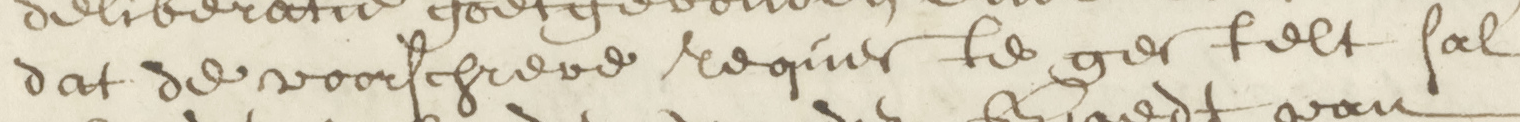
dat de voorschreve requeste gestelt sal
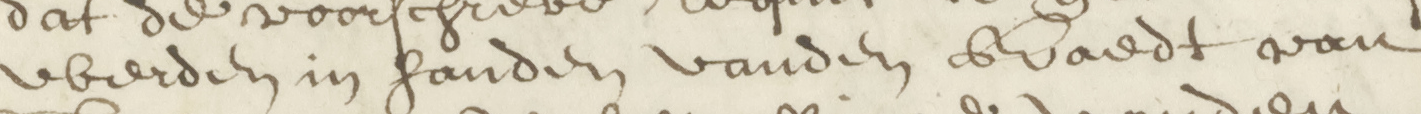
werden in handen vanden Raedt van
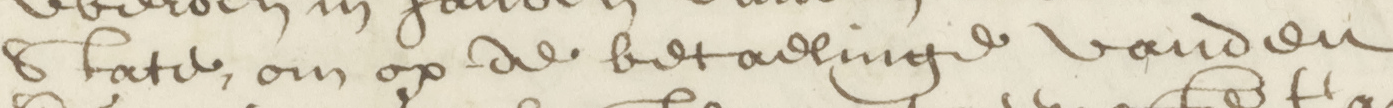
State, om op de betaelinge vanden
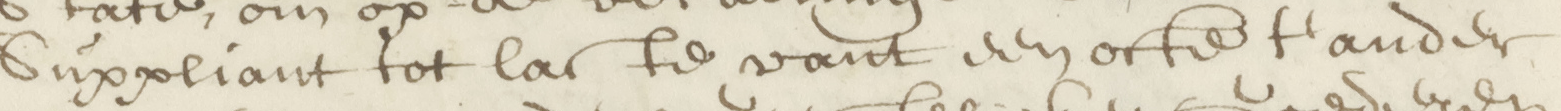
Suppliant tot laste vant een ofte t‛ander
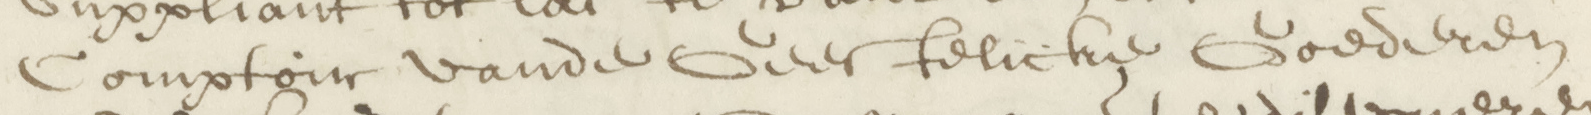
Comptoir vande Geestelicke Goederen
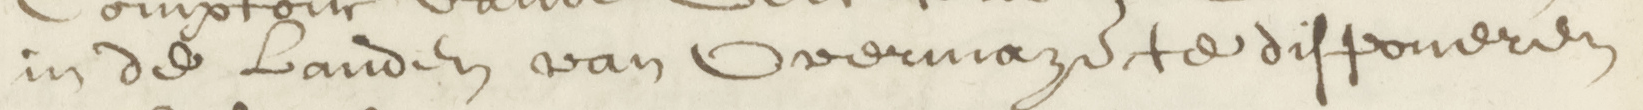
in de Landen van Overmaze, te disponeren
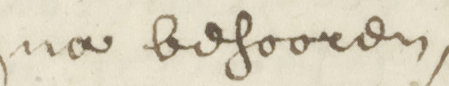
na behooren.
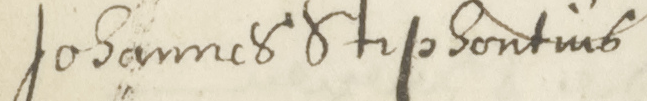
Johannes Stiphoutius
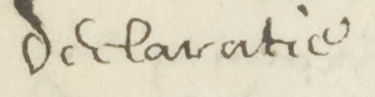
declaratie
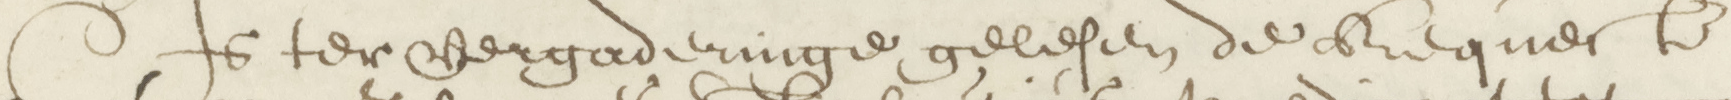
Is ter Vergaderinge gelesen de Requeste
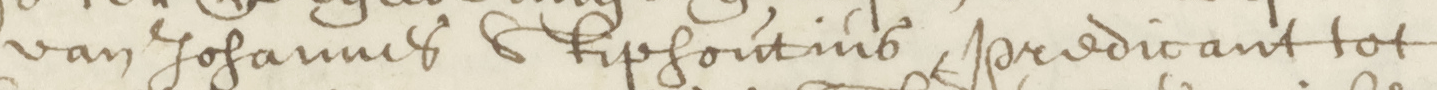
van Johannes Stiphoutius, predicant tot
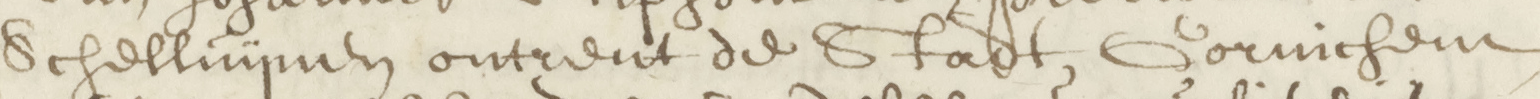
Schelluijnen ontrent de Stadt Gorinchem,
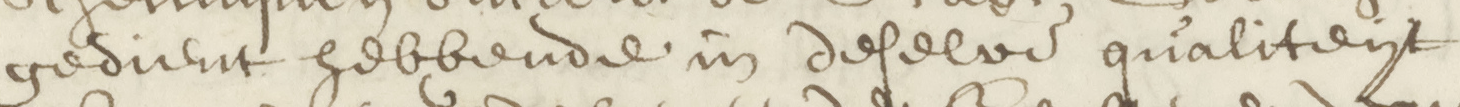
gedient hebbende in deselve qualiteijt
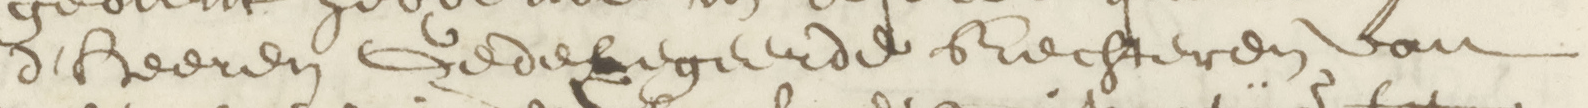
d‛Heeren Gedelegeerde Rechteren van
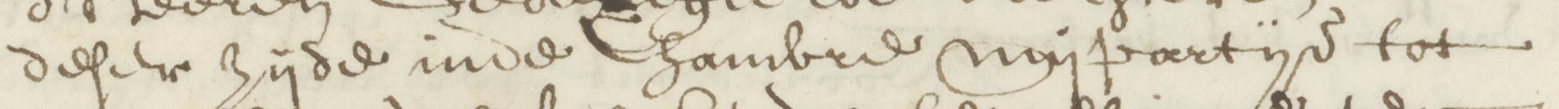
deser zijde inde Chambre Mijpartije tot
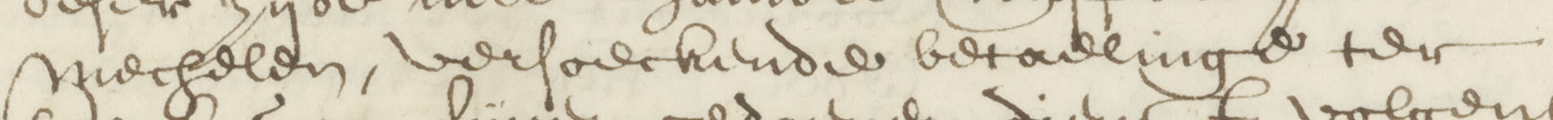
Mechelen, versoeckende betaelinge ter
